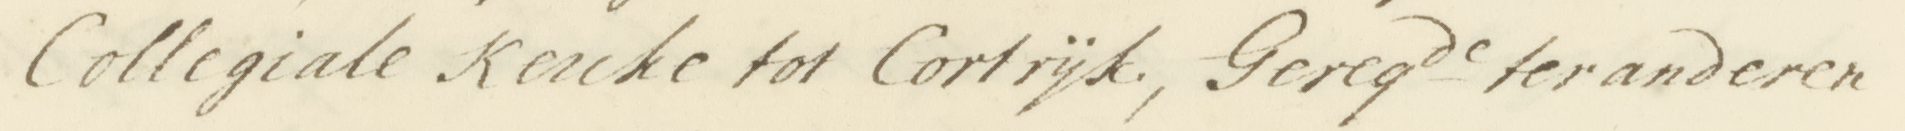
Collegiale Kerche tot Cortrijk, Gereqde ter anderen
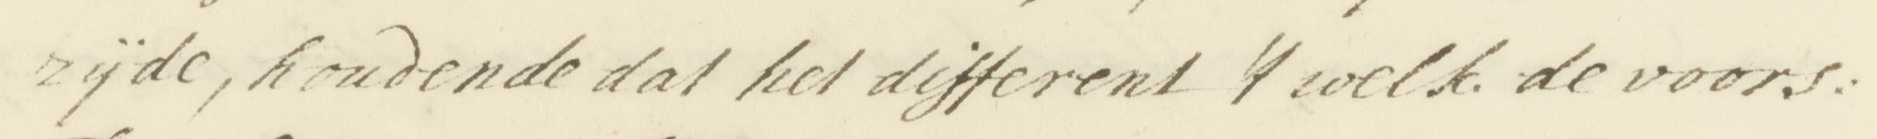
zijde, houdende dat het different 't welk de voors:
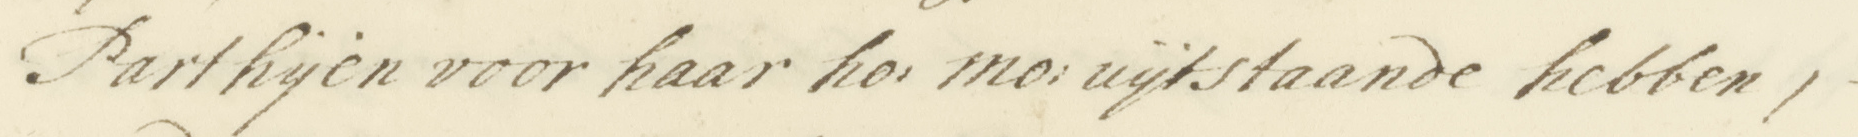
Parthijen voor haar ho:mo: uijtstaande hebben,
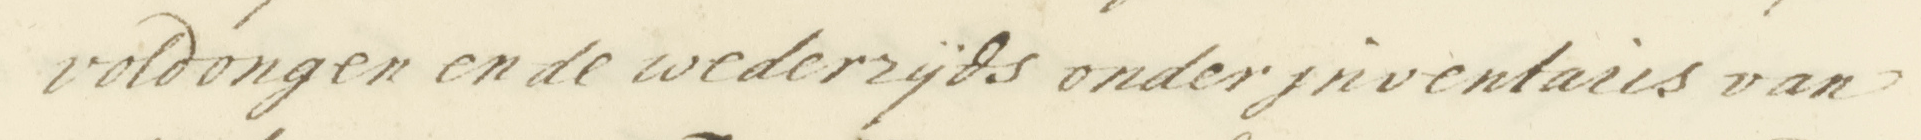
voldongen en de wederzijds onder inventaris van
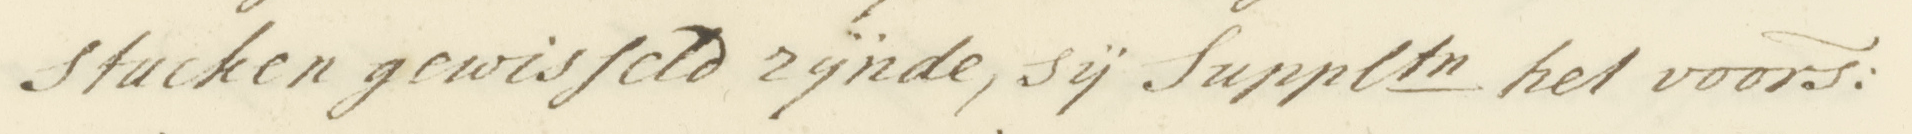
stucken gewisseld zijnde, sij suppltn. het voors:
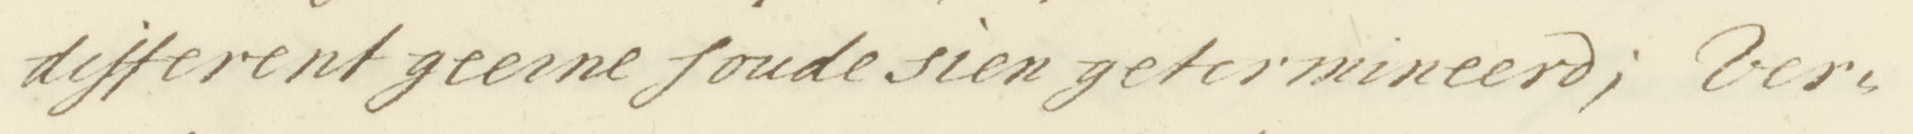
different geerne soude sien getermineerd; Ver,
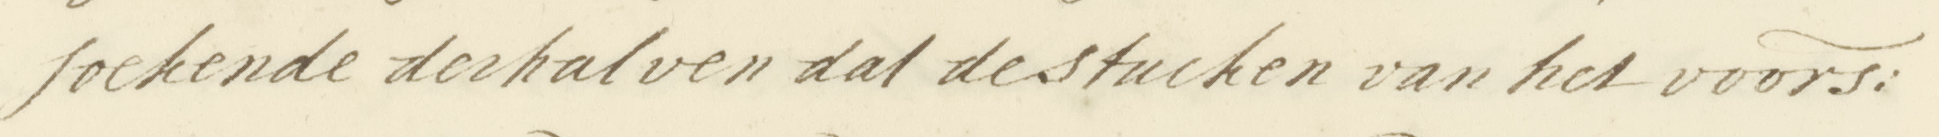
soekende derhalven dat de stucken van het voors:
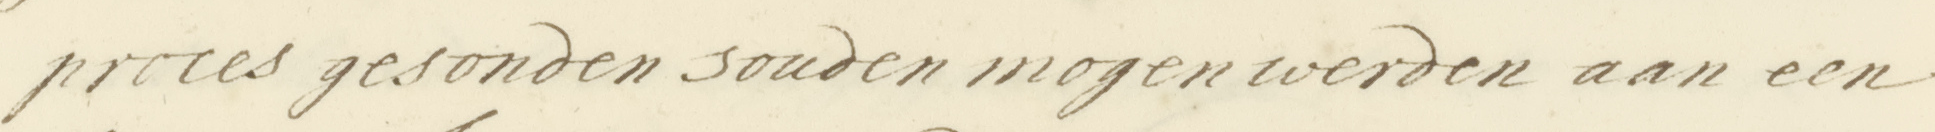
proces gesonden souden mogen werden aan een
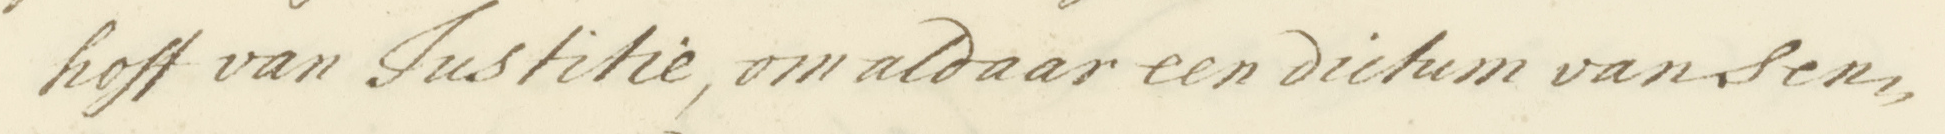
hoff van Justitie om aldaar een dictum van sen„
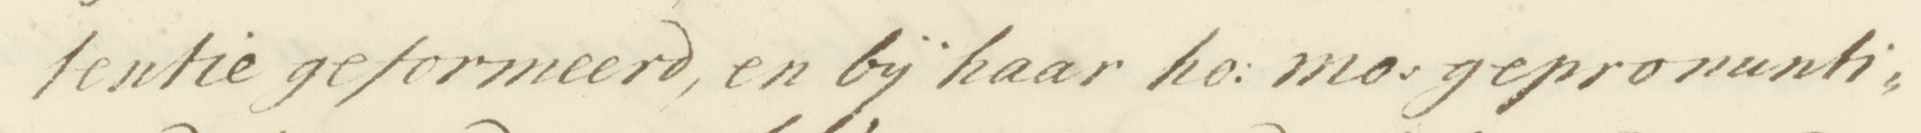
tentie geformeerd, en bij haar ho: mo: gepronunti„
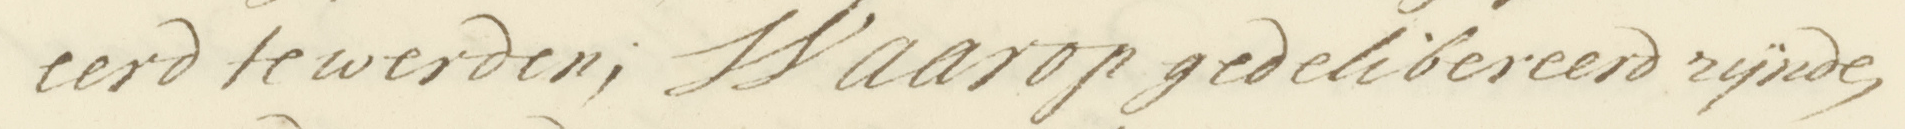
eerd te werden; Waarop gedelibereerd zijnde,
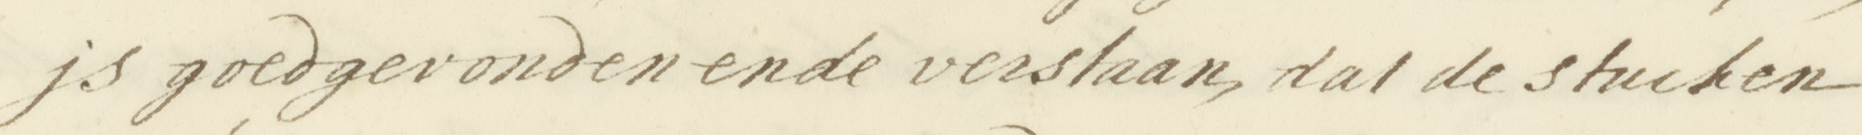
is goedgevonden ende verstaan, dat de stucken
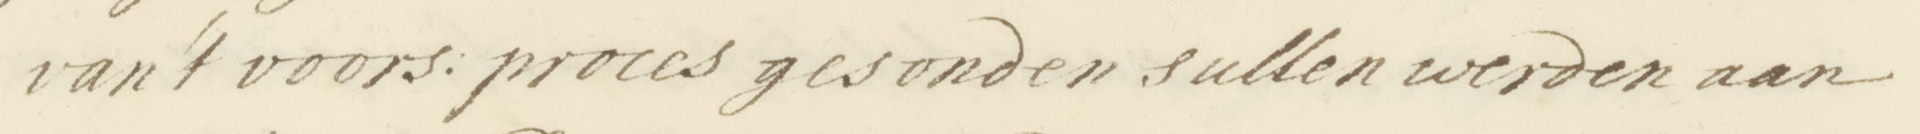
van 't voors: proces gesonden sullen werden aan
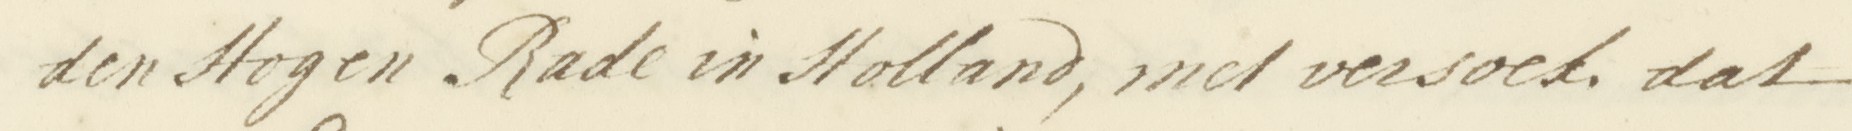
den Hogen Rade in Holland, met versoek dat
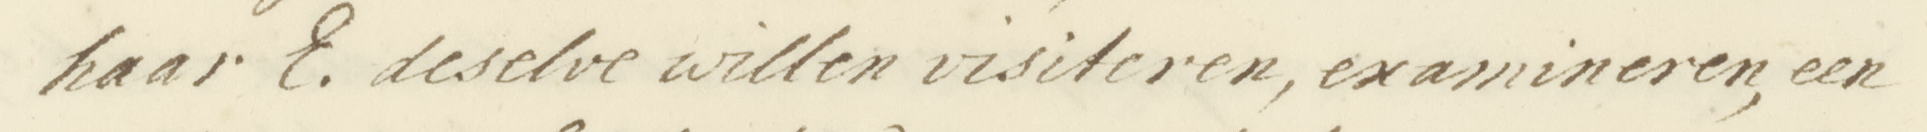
haar E. deselve willen visiteren, examineren, een
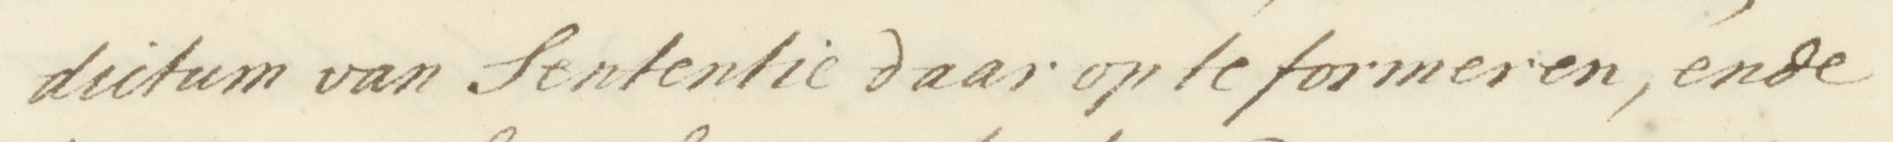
dectum van sententie daar op te formeren, ende
